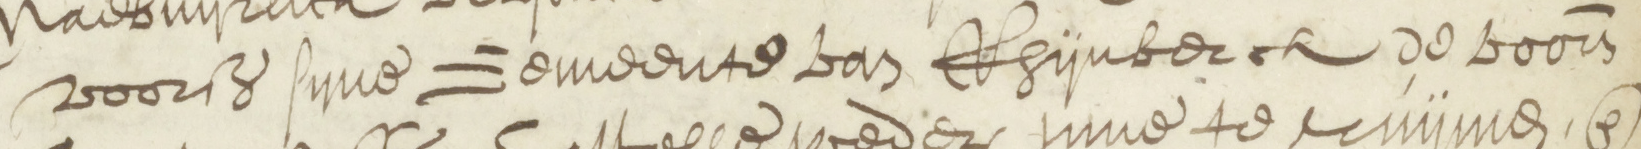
voorsz syne Gemeente van Rhijnberck de voorn
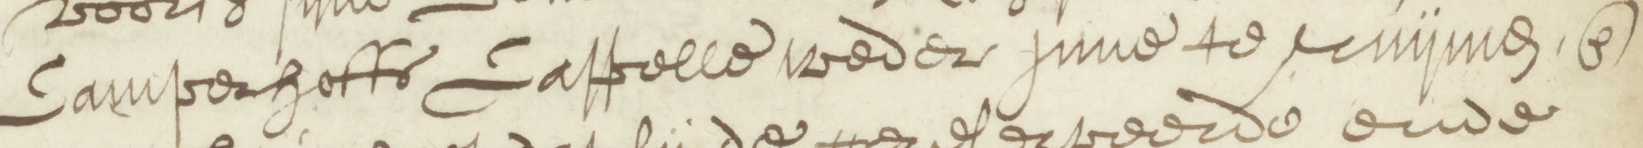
Camperhoffs Capelle weder Inne de ruijmen, &
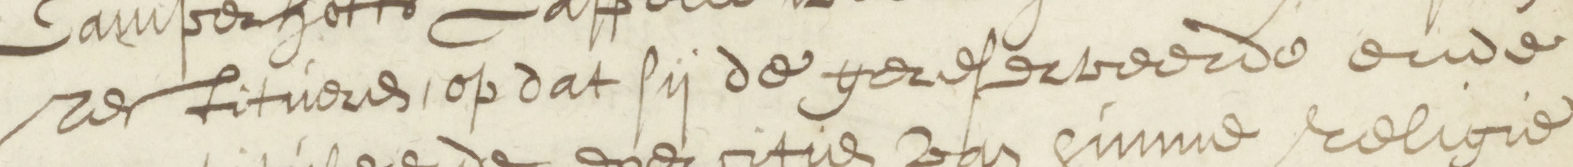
restitueren, op dat sij de gereserveerde ende
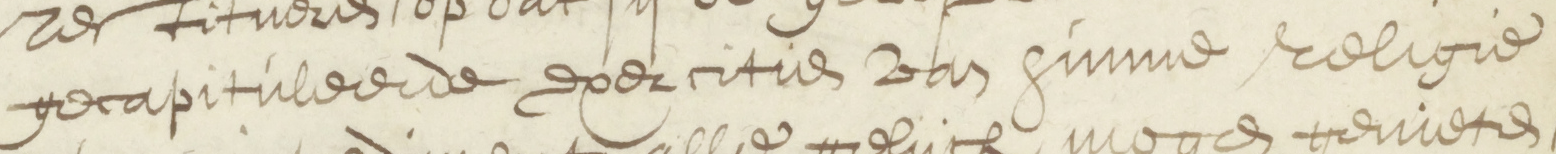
gecapituleerde exercitien van hunne religie
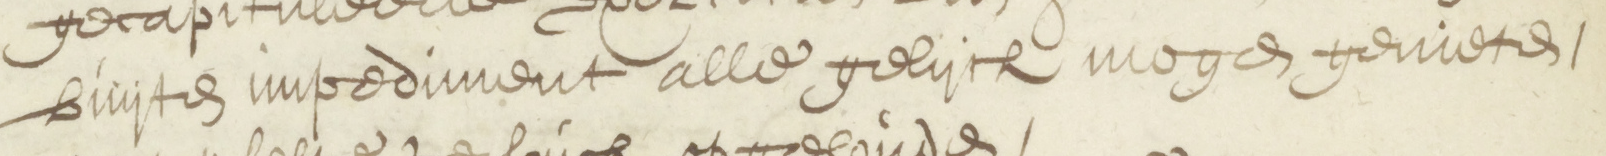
buijten impediment alle gelijck mogen genieten,
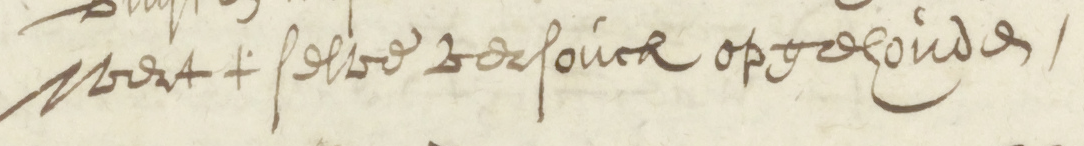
wert t' selve versouck opgehouden.
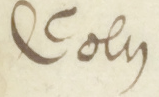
Coln
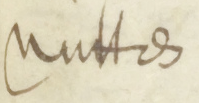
nutten
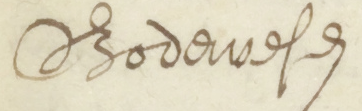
Bodewesen
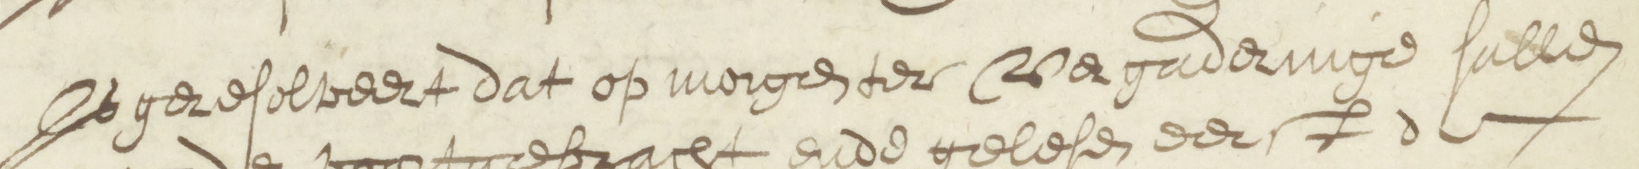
Is geresolveert dat op morgen ter Vergaderinge sullen
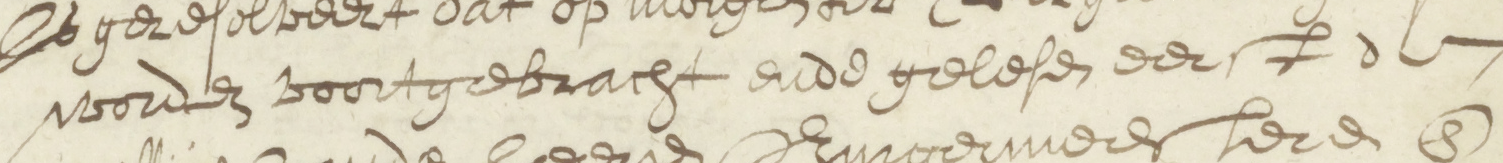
worden voortgebracht ende gelesen eerst de
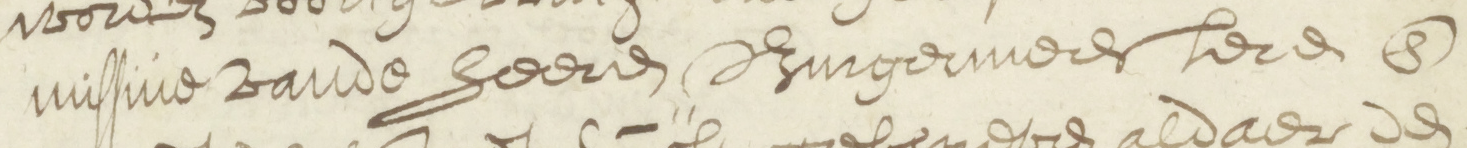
missive vande heeren Burgermeesteren &
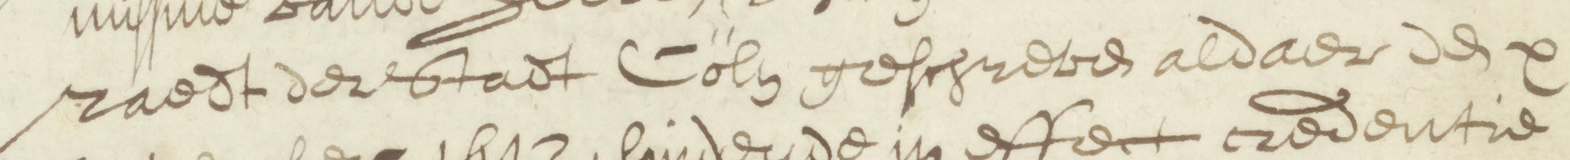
raedt der stadt Cöln geschreven aldaer den x.
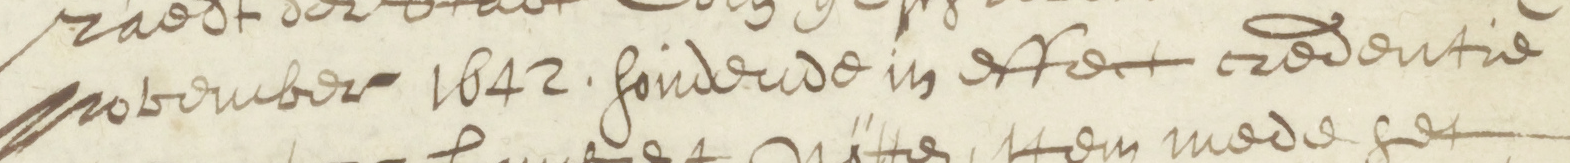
November 1642, houdende in effect credentie
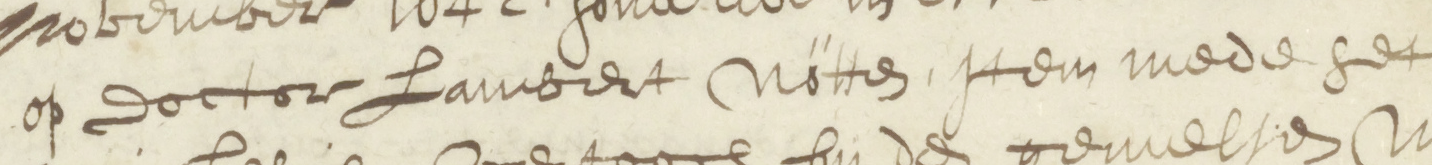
op Doctor Lambert nötten, Item mede het
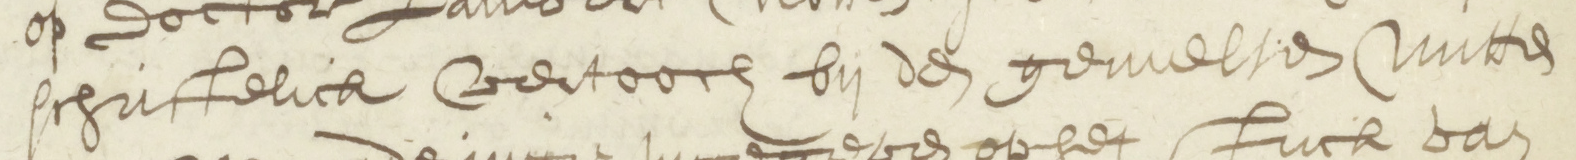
schriftelick vertooch bij den gemelten nutten
